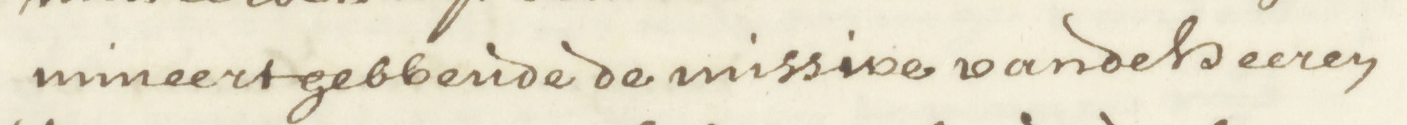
mineert hebbende de missive vande heeren
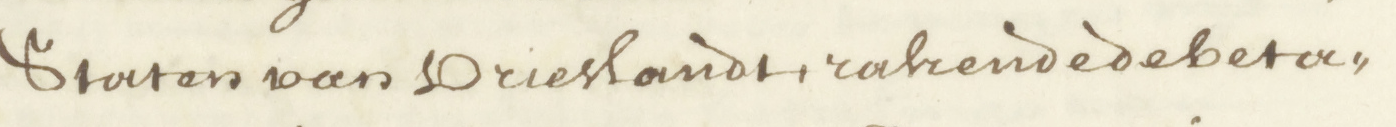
Staten van Vrieslandt, rakende de beta„
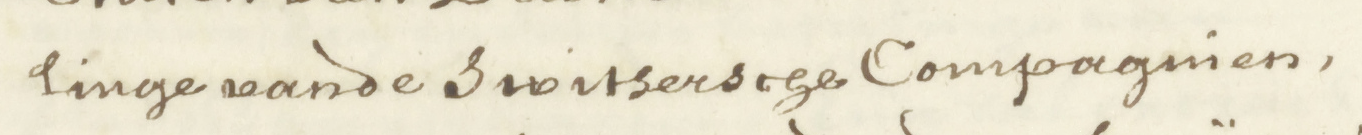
linge vande Switsersche Compagnien,
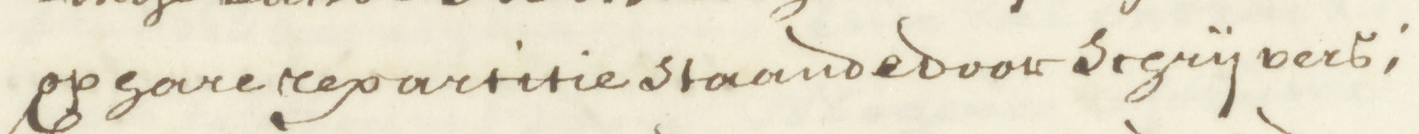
op hare repartitie staande door schrijvers;
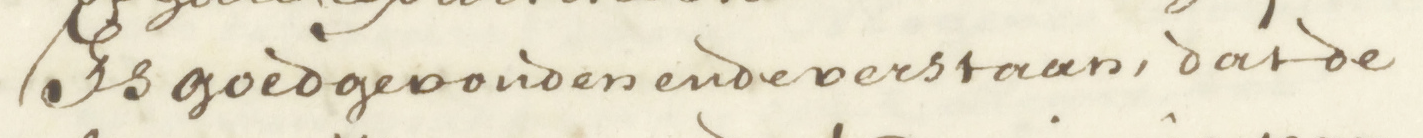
is goedgevonden ende verstaan, dat de
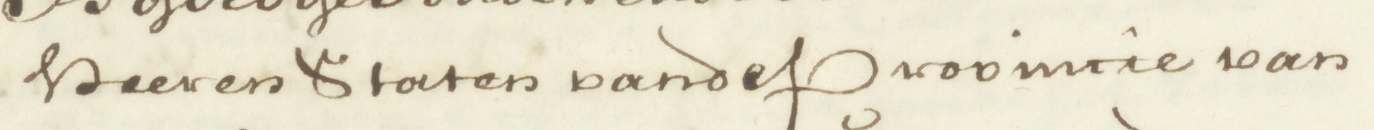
heeren Staten vande Provincie van
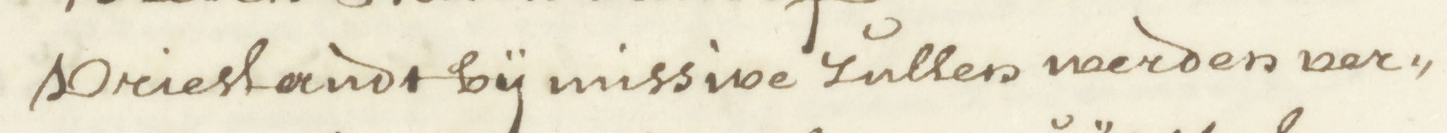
Vrieslandt bij missive zullen werden ver„
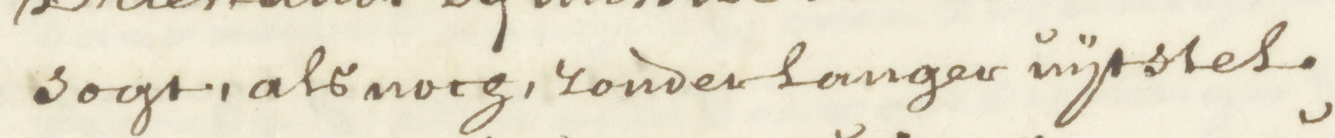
sogt, als noch zonder langer uijtstel
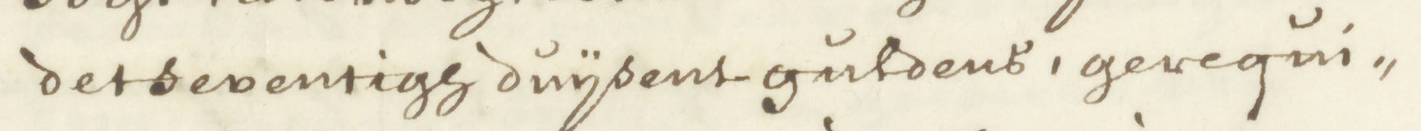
de tseventigh duijsent guldens, gerequi„
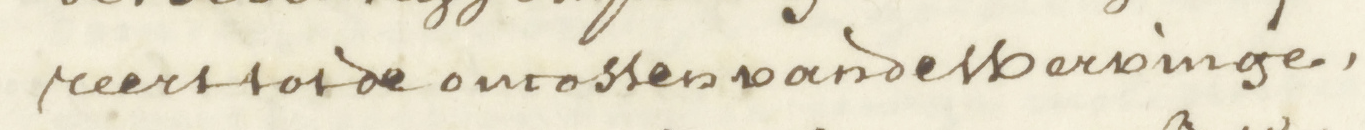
reert tot de oncosten vande wervinge
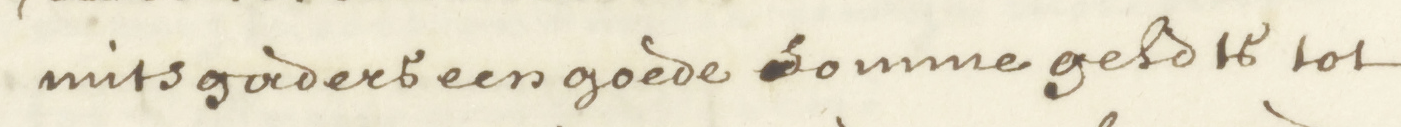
mitsgaders een goede somme geldts tot
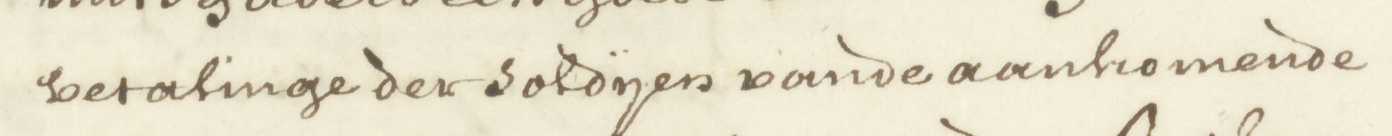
betalinge der soldijen vande aankomende
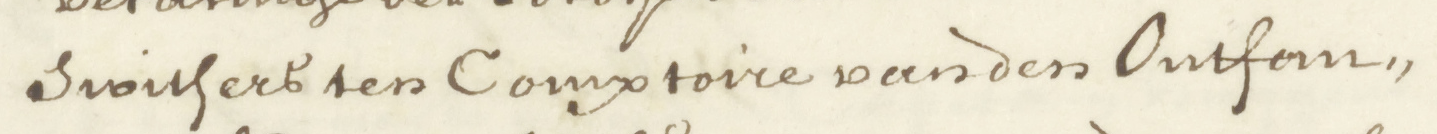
Switsers ten Comptoire vanden Ontfan„
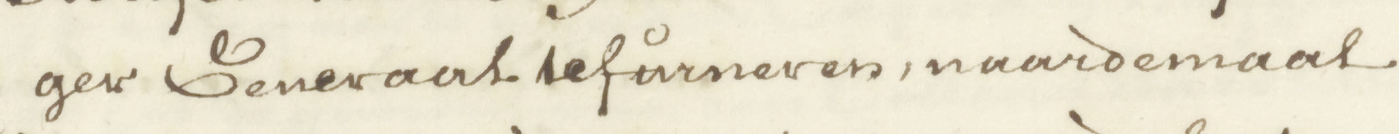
ger Generaal te furneren, naardemaal
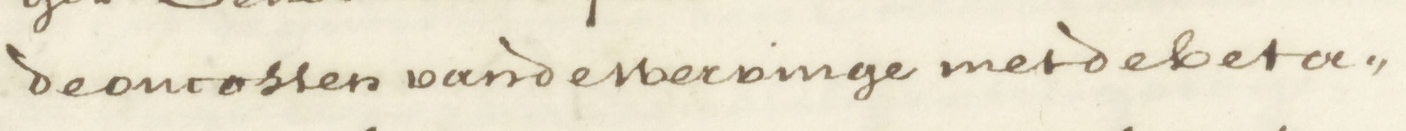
de oncosten vande wervinge met de beta„
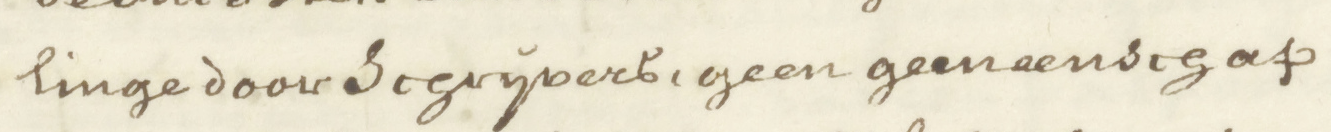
linge door Schrijvers, geen gemeenschap
